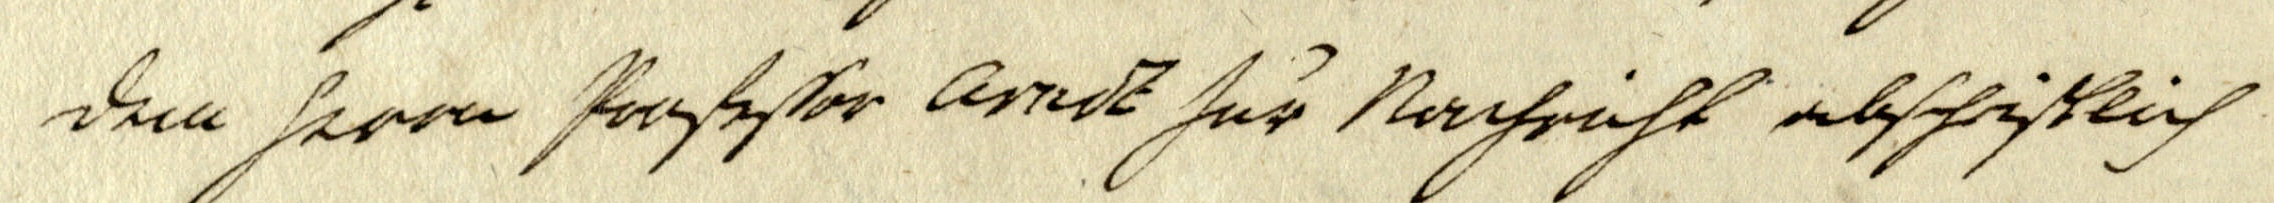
dem herrn Professor Arndt zur Nachricht abschriftlich
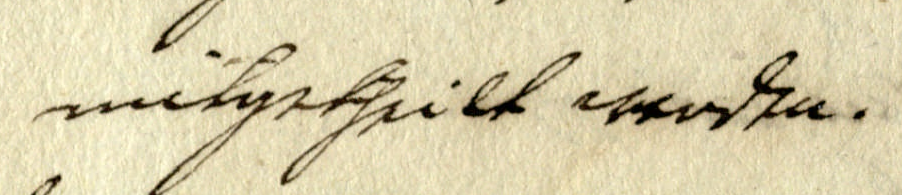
mitgetheilt werden.
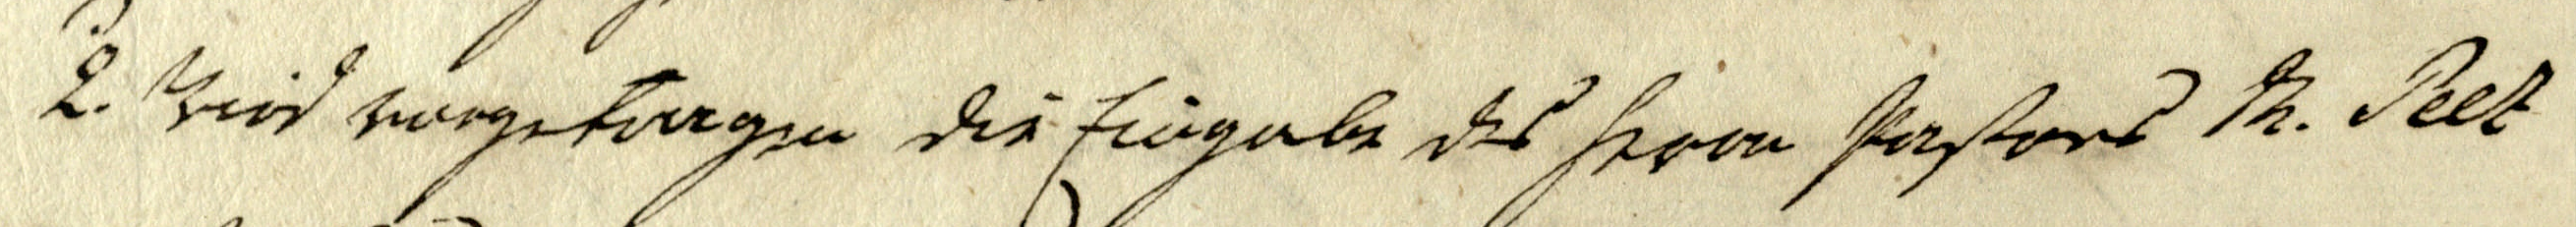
2. Wird vorgetragen die Eingabe des herrn Pastors M. Pelz
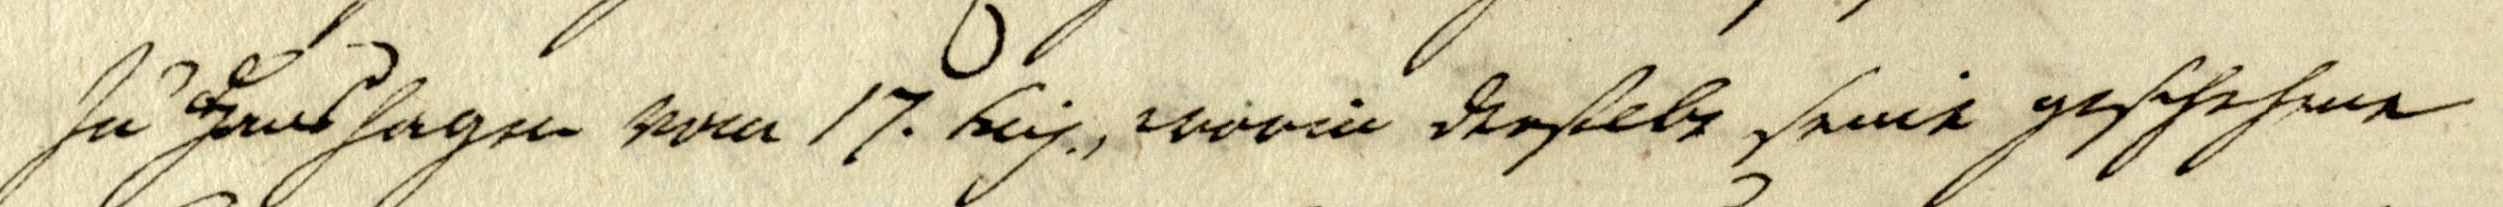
zu Hanshagen vom 17. huj., worin derselbe seine geschehene
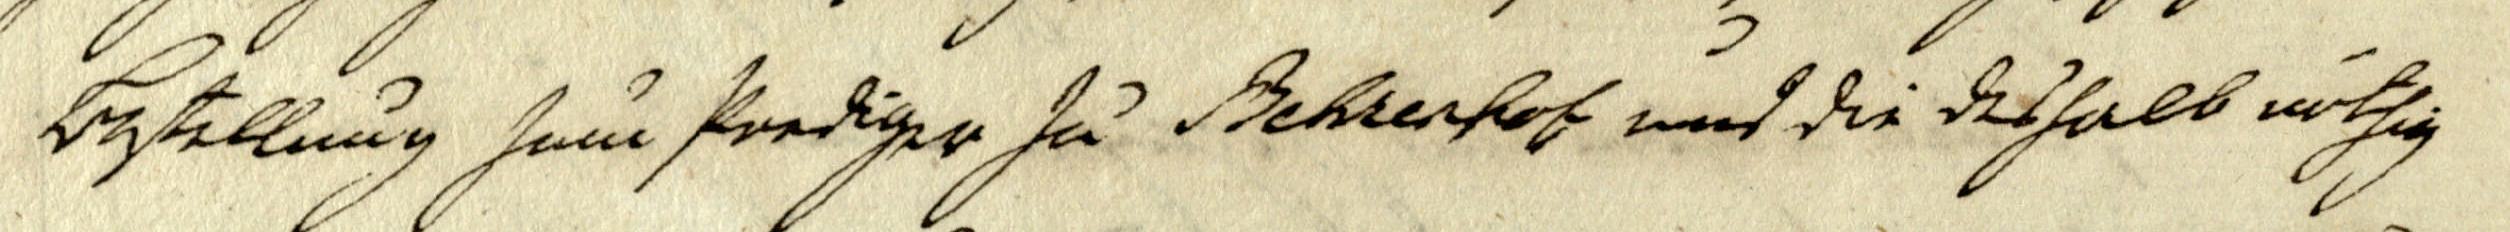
Bestellung zum Prediger zu Behrenhof und die deshalb nöthig
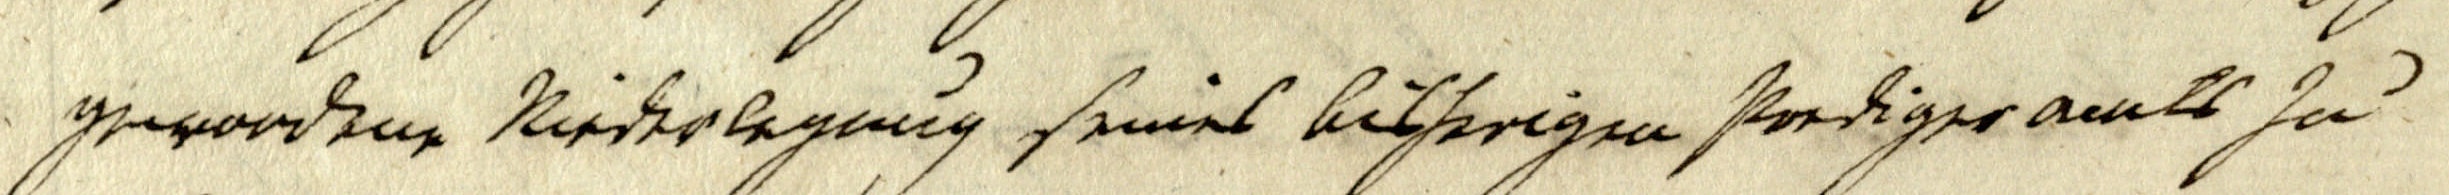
gewordene Niederlegung seines bisherigen Predigeramts zu
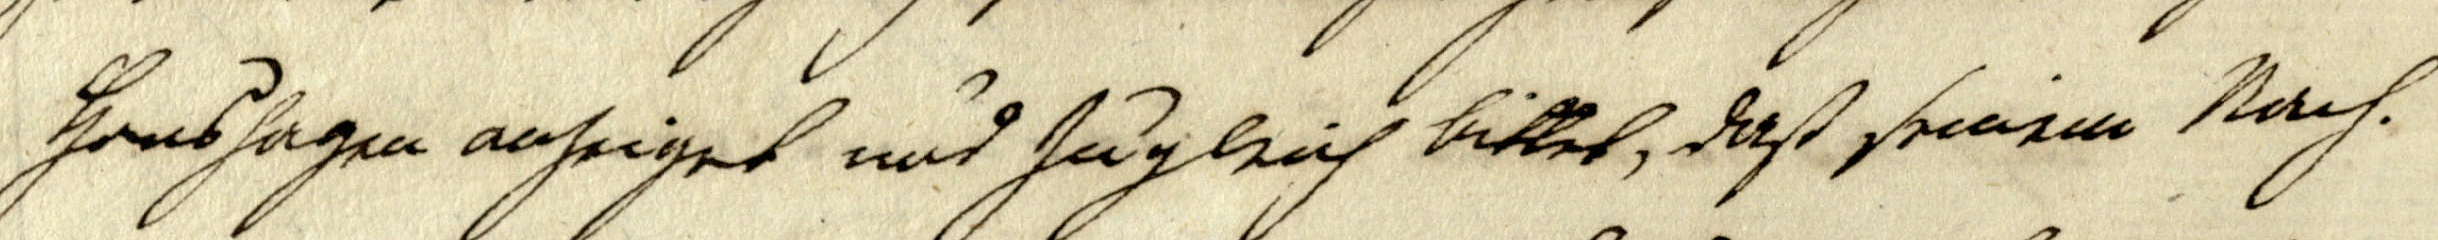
Hanshagen anzeiget und zugleich bittet, daß seinem Nach¬
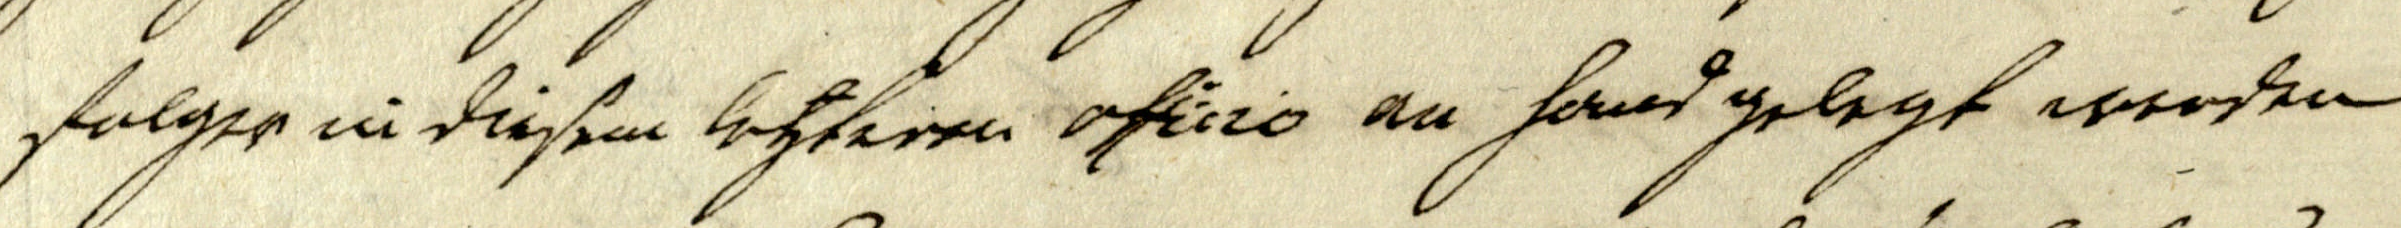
folger in diesem letzteren officio an hand gelegt werden
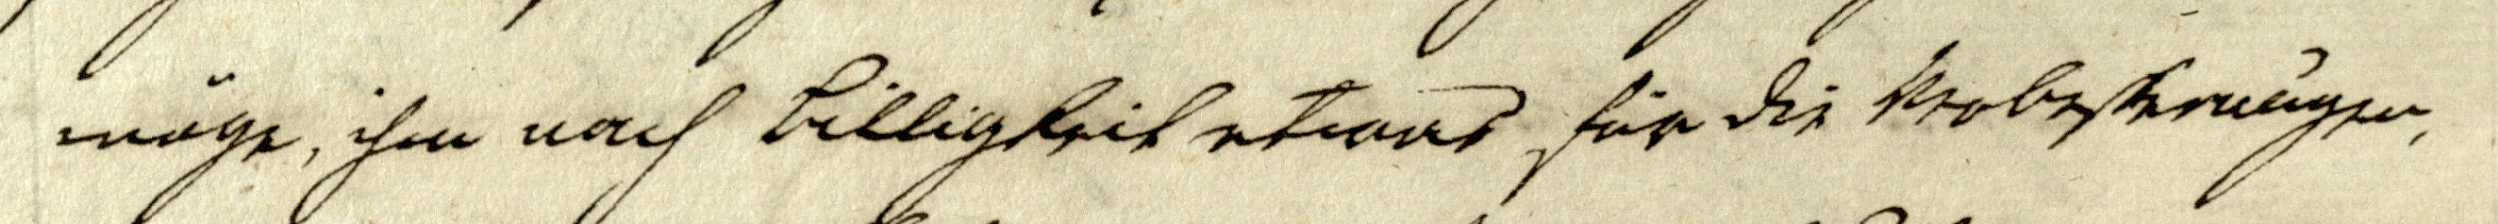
möge, ihm nach Billigkeit etwas für die Verbesserungen,
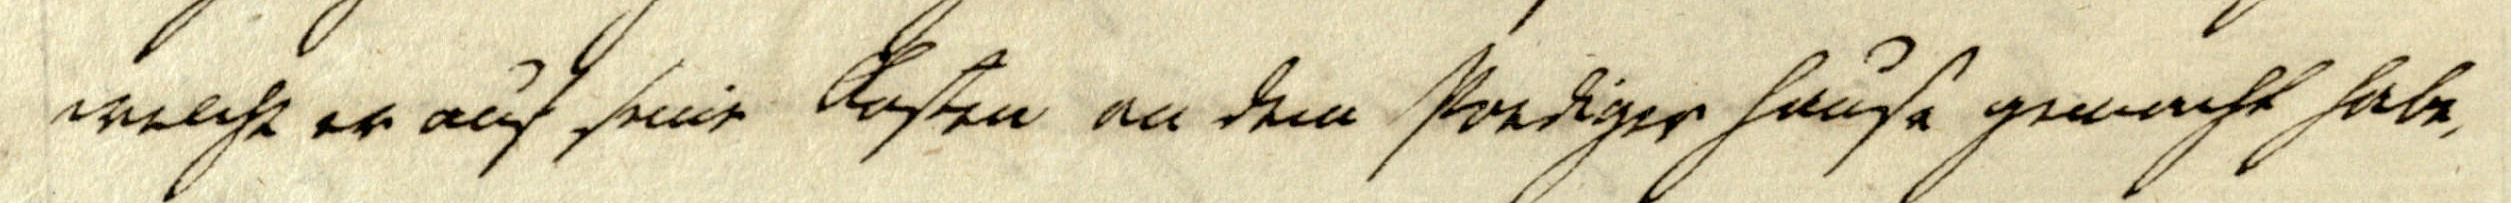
welche er auf seine Kosten an dem Prediger hause gemacht habe,
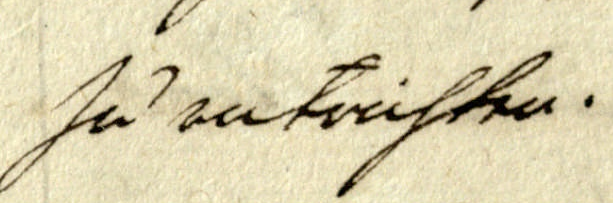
zu entrichten.
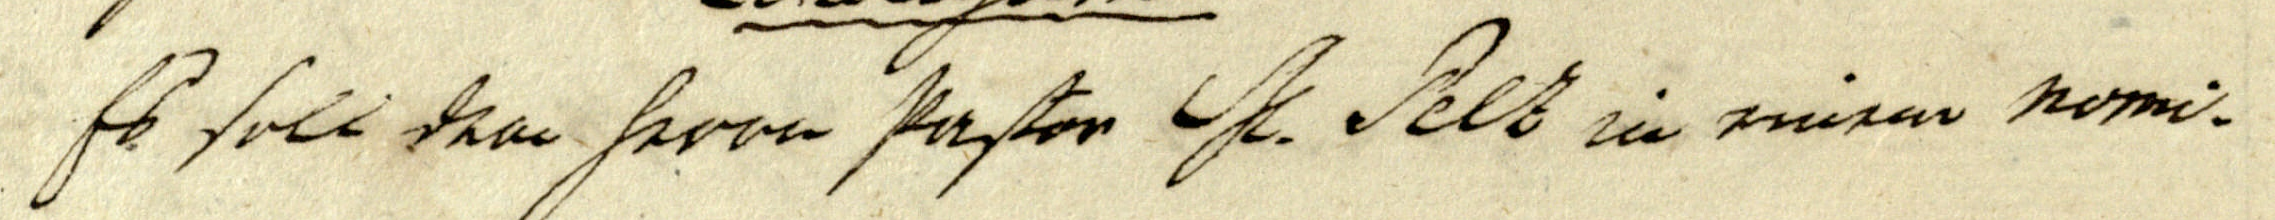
Es soll dem Pastor M. Pelz in einem nomi¬
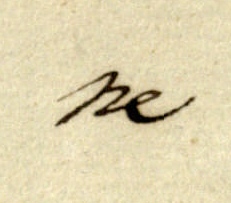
ne
